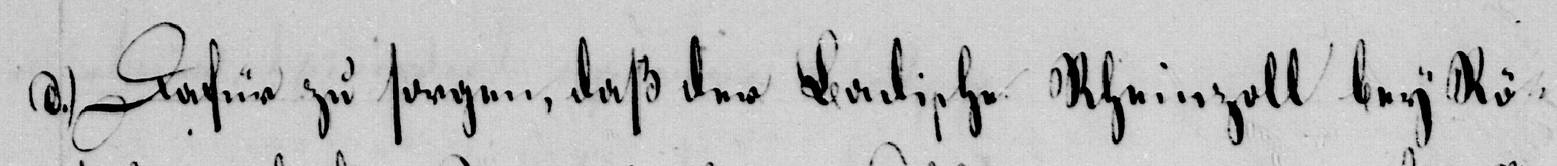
d.) Dafür zu sorgen, daß der Badische Rheinzoll bey Rö¬
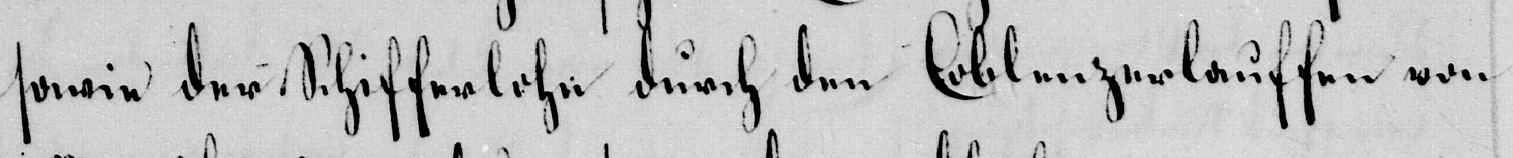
sowie der Schifferlohn durch den Coblenzerlauffen von
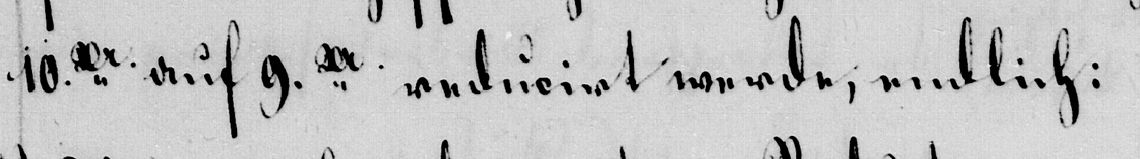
10.Xr auf 9.Xr reducirt werde, endlich:
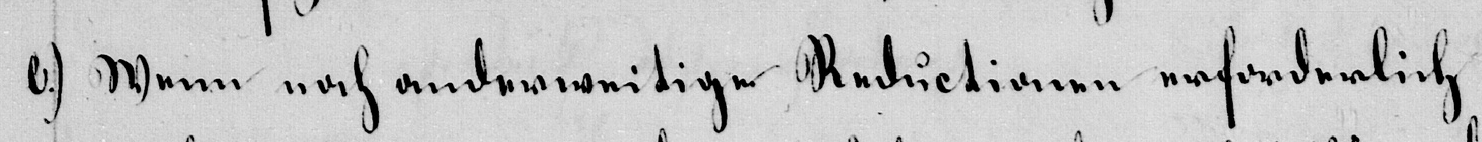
e.) Wenn noch anderweitige Reductionen erforderlich
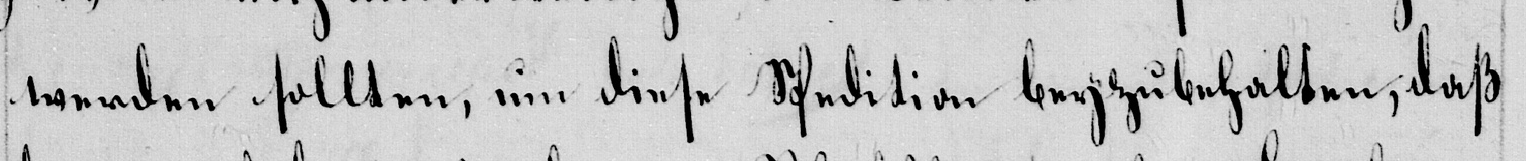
werden sollten, um diese Spedition beyzubehalten, daß
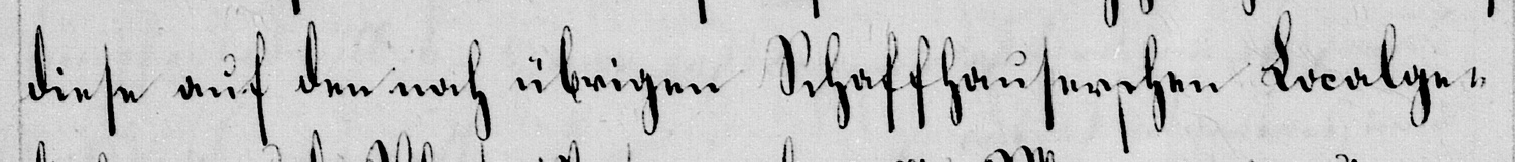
diese auf den noch übrigen Schaffhauserschen Localge¬
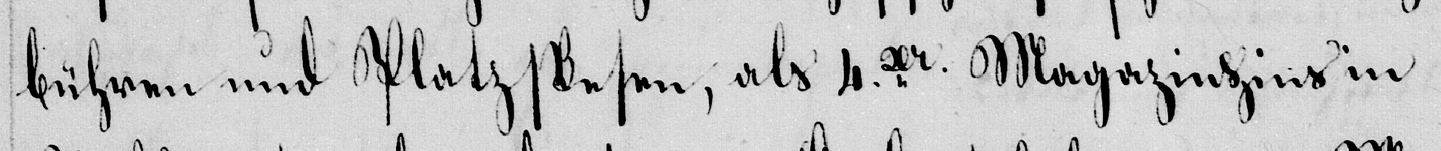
bühren und Platzspesen, als 4.Xr Magazinzins in
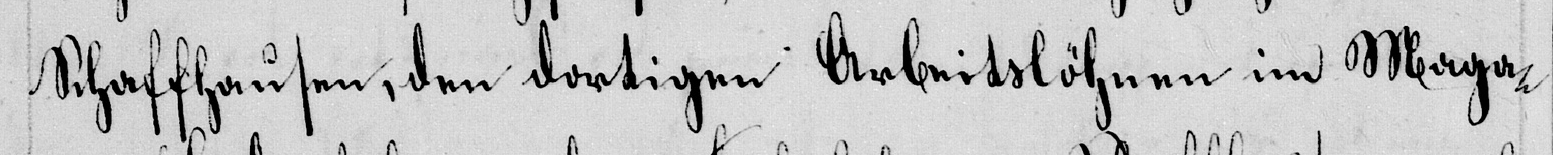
Schaffhausen, den dortigen Arbeitslöhnen im Maga¬
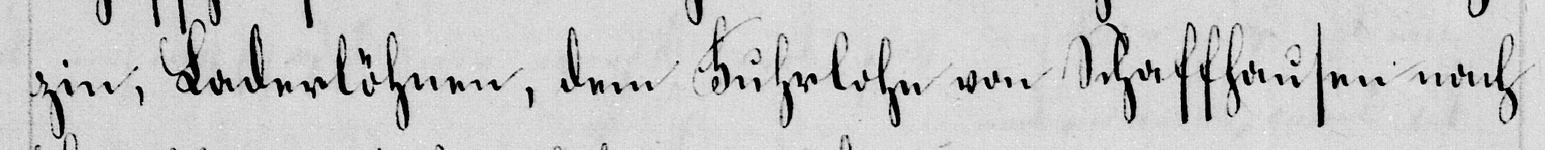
zin, Laderlöhnen, dem Fuhrlohn von Schaffhausen nach
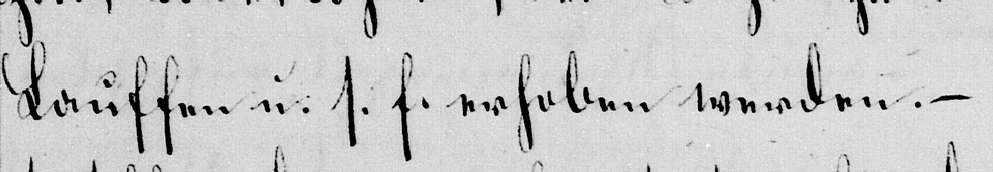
Lauffen u. s. f. erhoben werden.
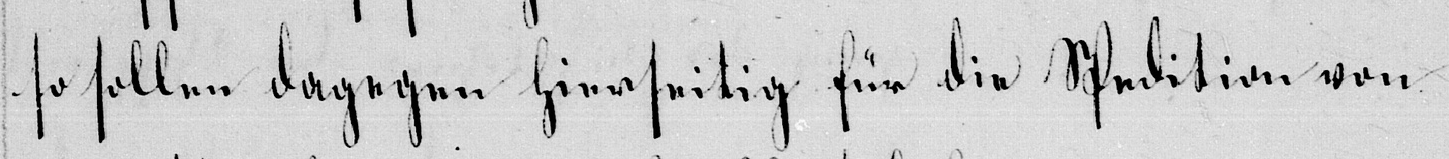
so sollen dagegen hierseitig für die Spedition von
